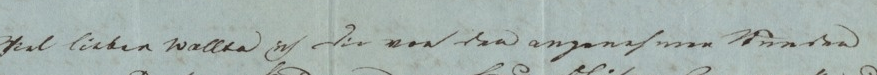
Viel lieber wollte ich Dir von den angenehmen Stunden
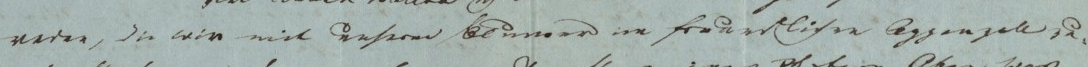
reden, die wir mit unserm Blumer im freundlichen Appenzell zu-
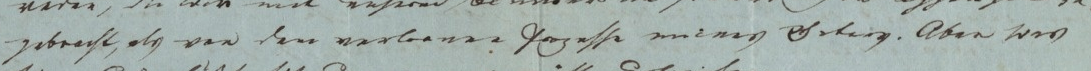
gebracht, als von dem verlornen Prozesse meines Vaters. Aber was
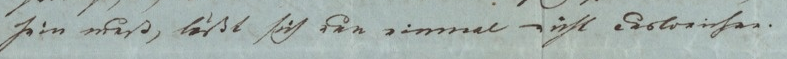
sein muß, läßt sich nun einmal nicht ausweichen.
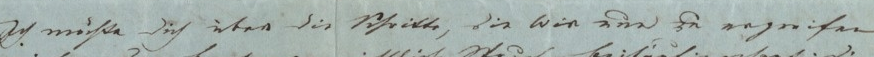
Ich möchte Dich über die Schritte, die wir nun zu ergreifen
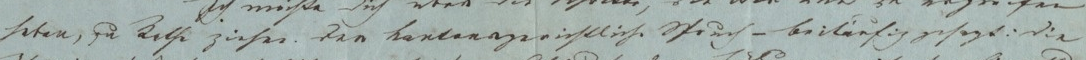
haben, zu Rathe ziehen. Der kantonsgerichtliche Spruch – beiläufig gesagt: die
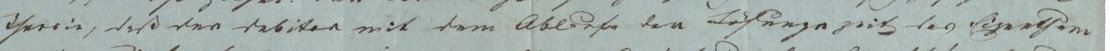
Theorie, daß der Debitor mit dem Ablaufe der Lösungszeit das Eigenthum
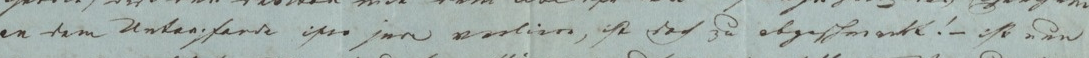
an dem Unterpfande ipso jure verliere, ist doch zu abgeschmackt! – ist nun
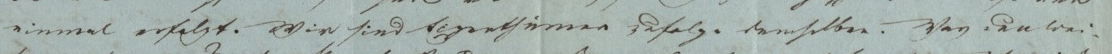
einmal erfolgt. Wir sind Eigenthümer zufolge demselben. Was nun wei-
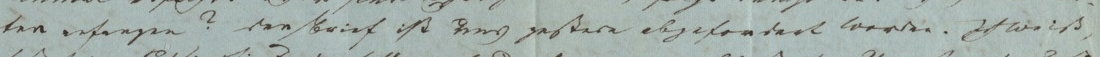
ter anfangen? Der Brief ist uns gestern abgefordert worden. Ich weiß,
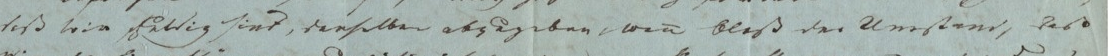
daß wir schuldig sind, denselben abzugeben, wenn bloß der Umstand, daß
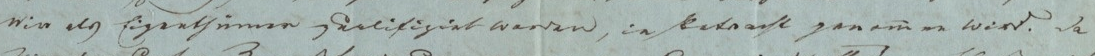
wir als Eigenthümer qualifizirt werden, in Betracht genommen wird. Da
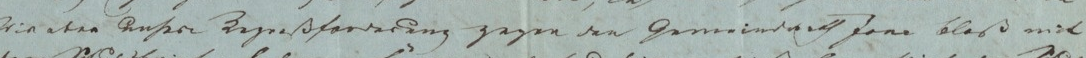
wir aber unsere Regreßforderung gegen den Gemeindrath Jona bloß mit
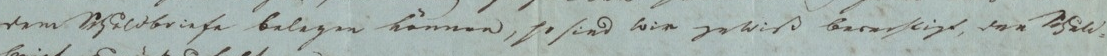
dem Schuldbriefe belegen können, so sind wir gewiß berechtigt, den Schuld-
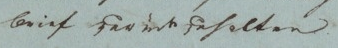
brief zurückzuhalten.
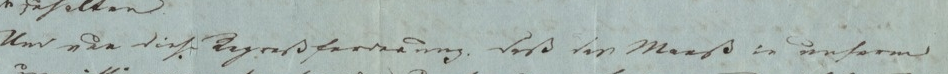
Und nun diese Regreßforderung. Daß das Maaß in unserm
